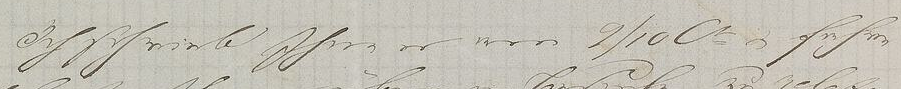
Ich schrieb Ihnen es am 9./10. Ct & fahre
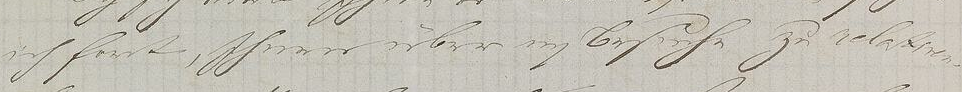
ich fort, Ihnen über m. Besuche zu relatiren.
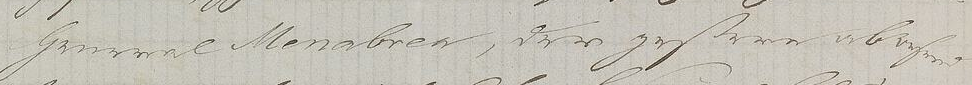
General Menabrea, der gestern abwesend
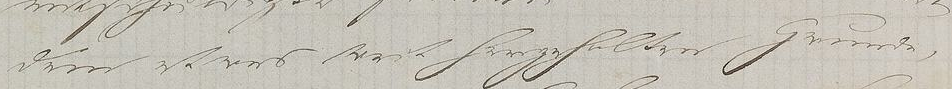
dem etwas weit hergeholten Grunde,
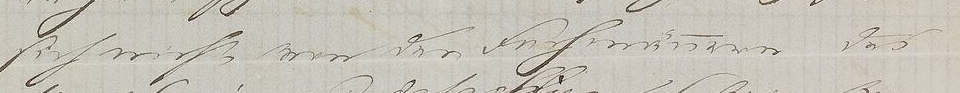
sich nicht von den Fachmännern des
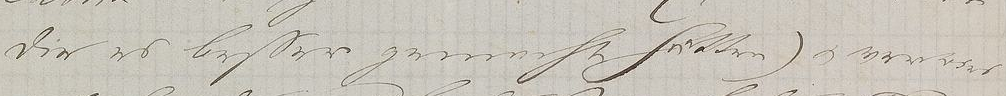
die es besser gemacht hätten) & verwies
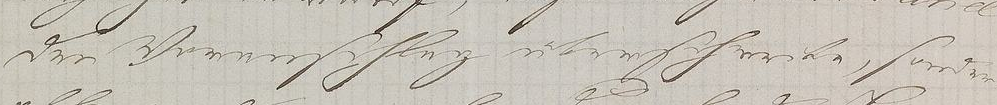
den Voranschlag überschreite, sondern
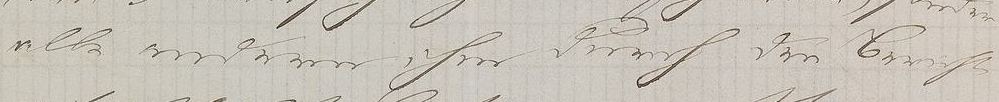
alle andern ihm durch den Bericht
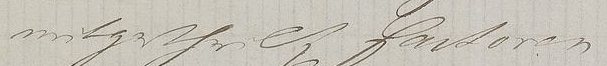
mitgetheilten Factoren. –
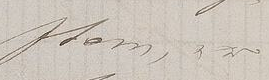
Item, er
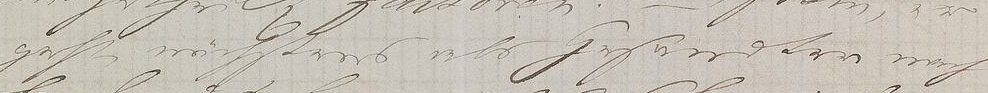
geht nächstens als Gesandter nach
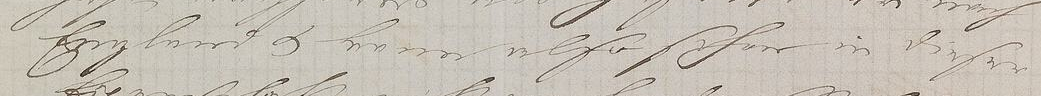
England & kann also schon in dieser
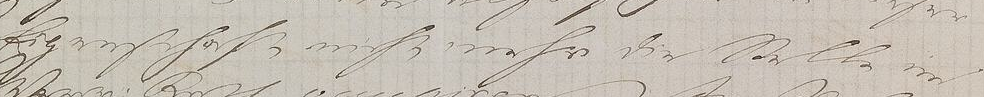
Eigenschaft nicht mehr die Stelle
